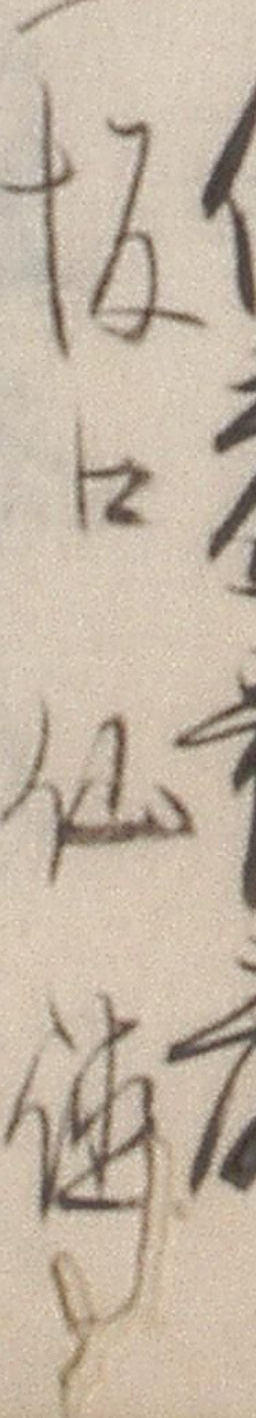坂口仙徳
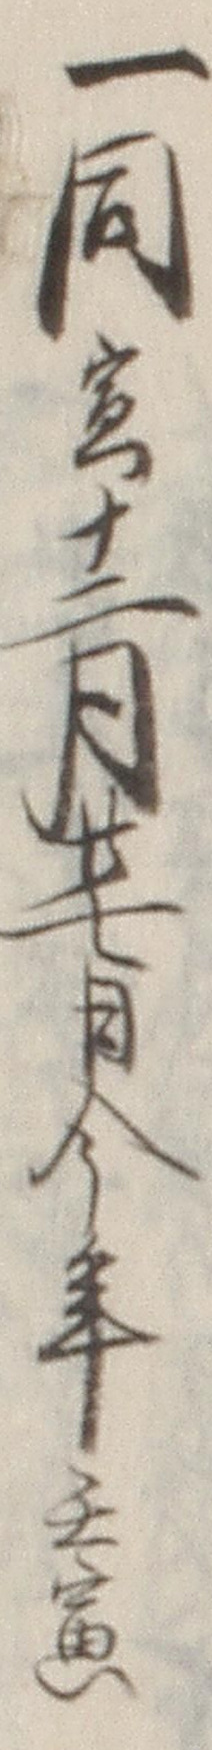一同寅十二月廿七日今年壬寅
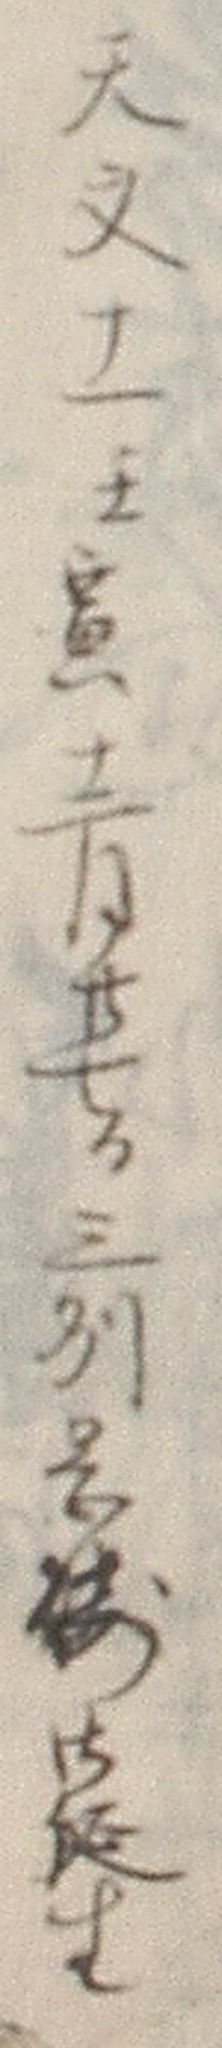天文十一壬寅十二月廿七日三州岡崎御誕生
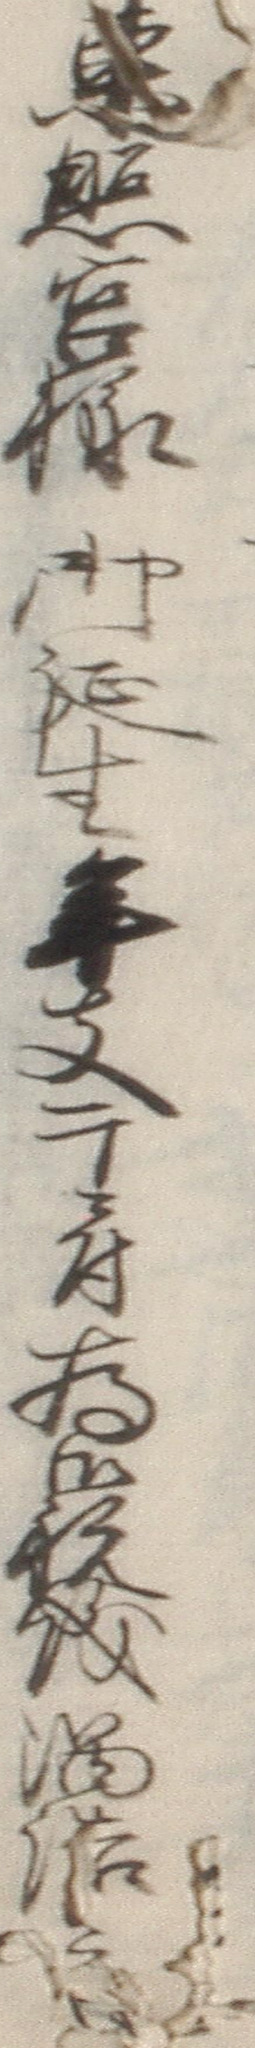東照宮様御誕生年支干ニ付為御祝儀溜詰之間
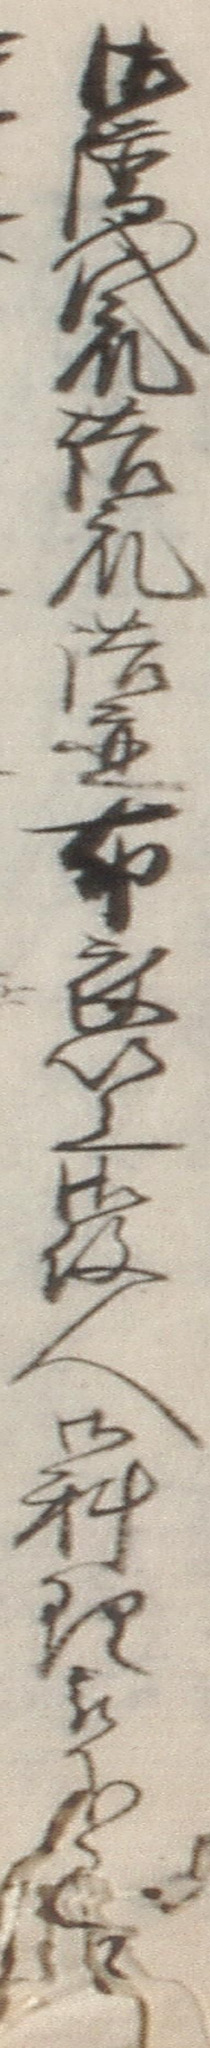御譜代衆詰衆詰並布衣以上御役人御料理被下之
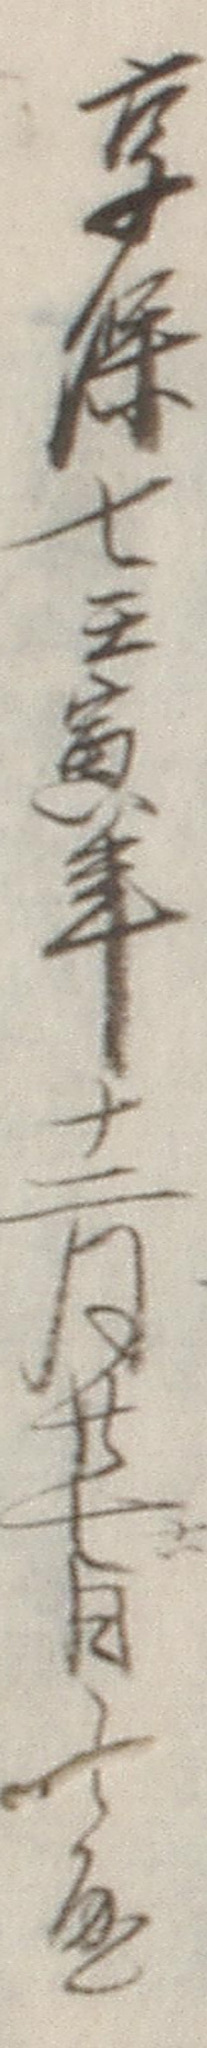享保七壬寅年十二月廿七日之通
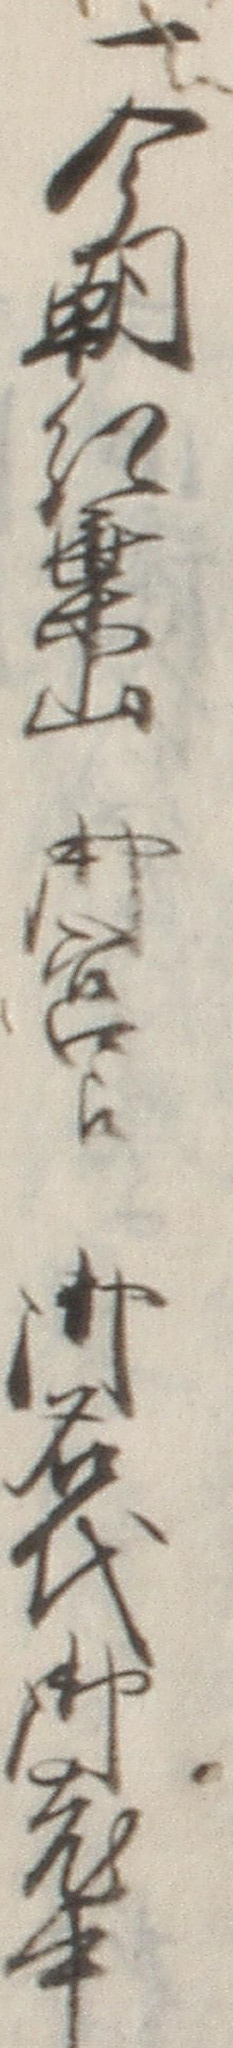一今朝紅葉山御宮え御名代御老中
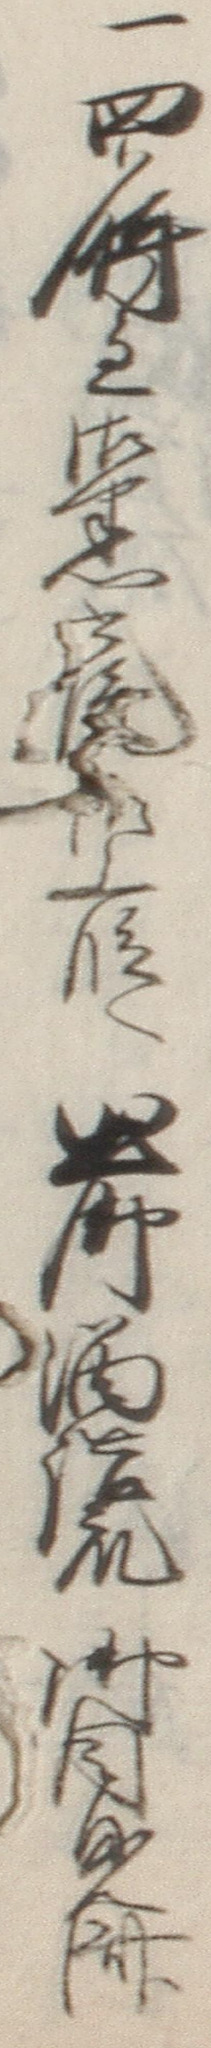一四ツ時過御黒書院御上段へ出御溜詰衆御目見済
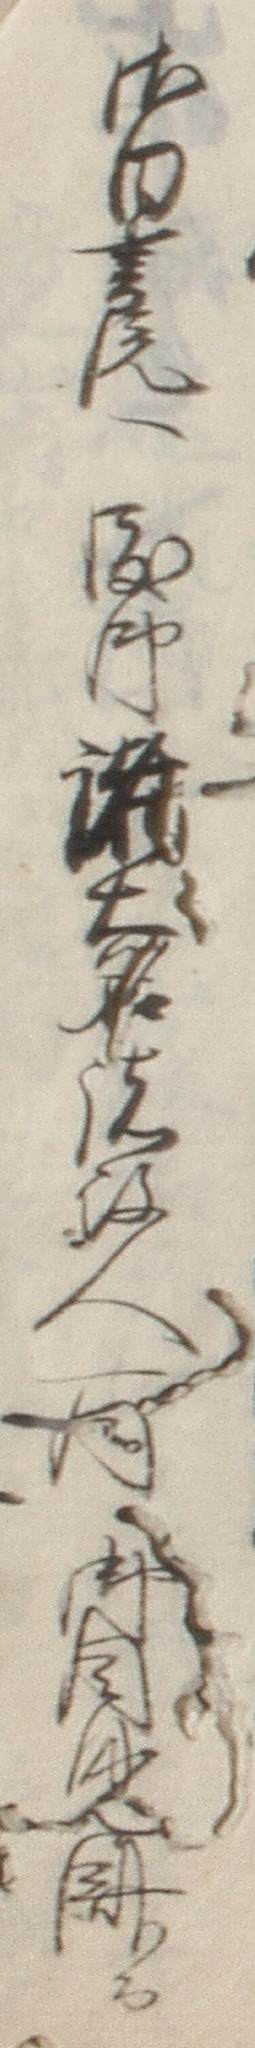御白書院へ渡御諸大名諸役人一同御目見済而

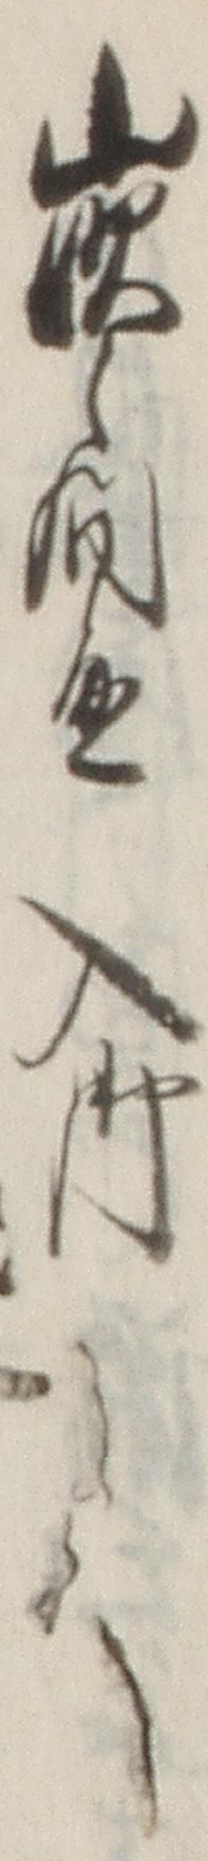山吹の間通入御
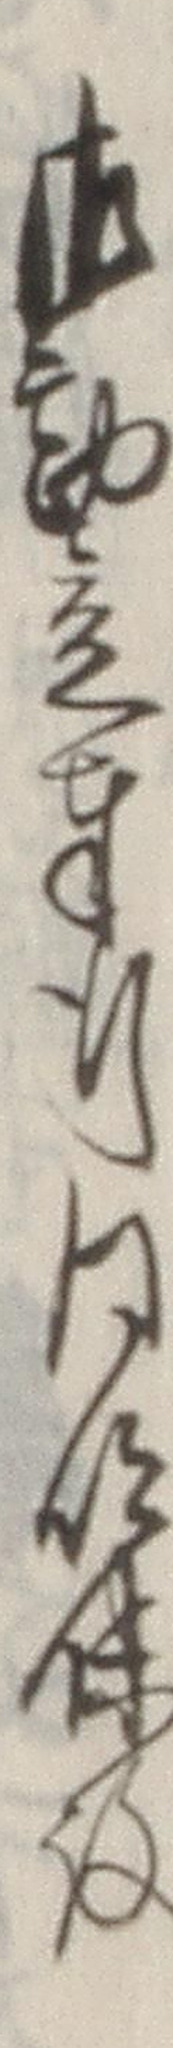御勘定奉行同吟味役
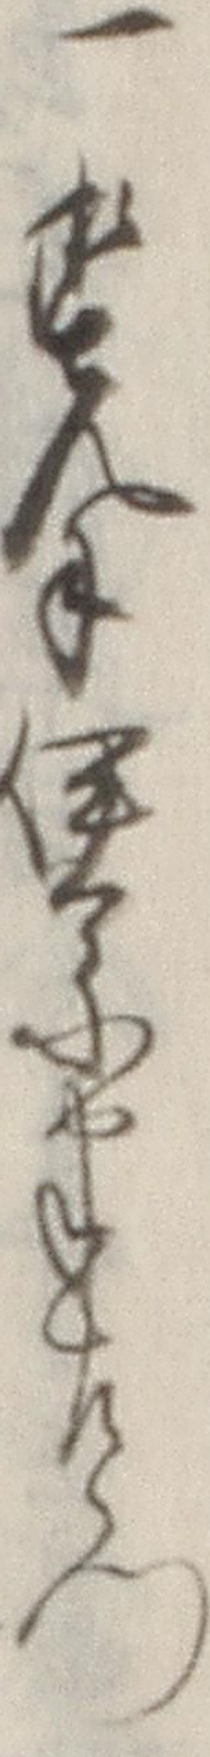一御先手伊奈半左衛門
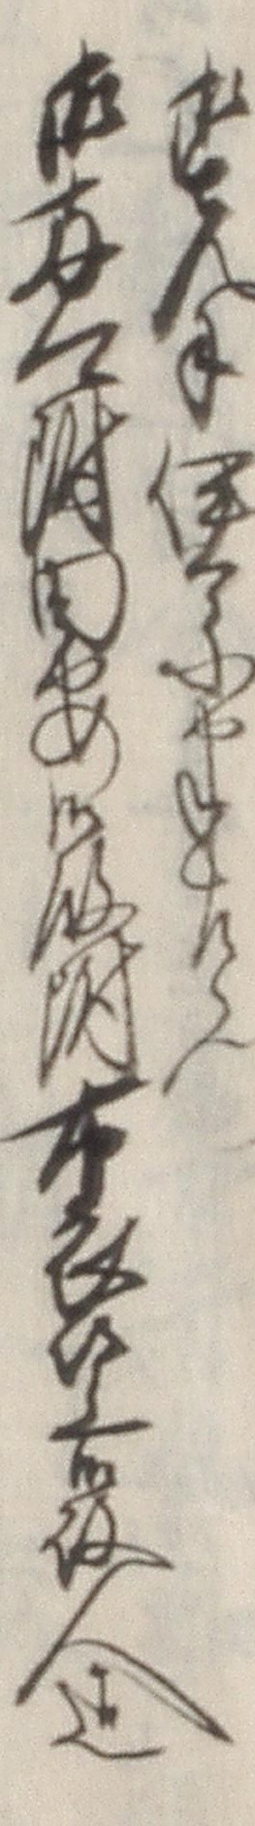御両郷附田安御領附布衣以上御役人迄紅葉間
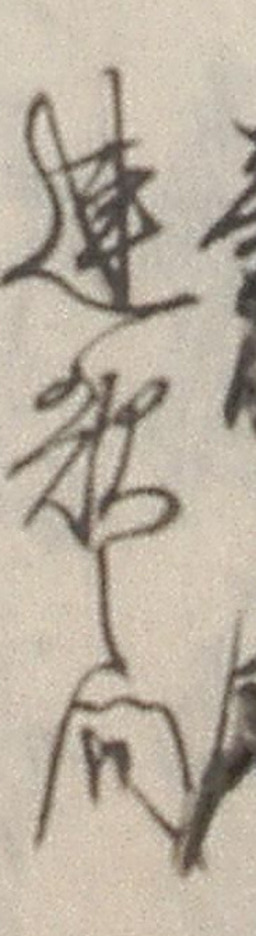連歌の間
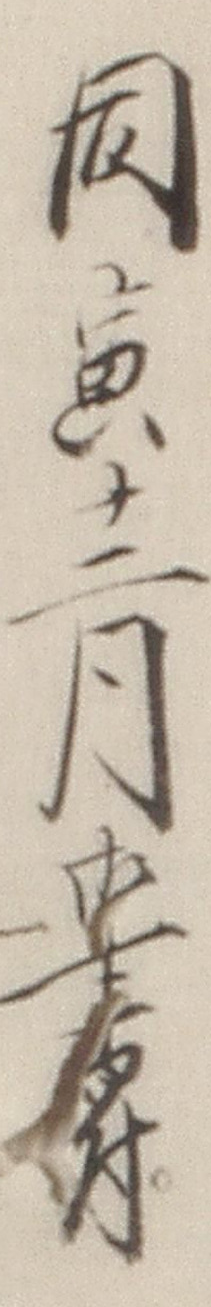同寅十二月御書付
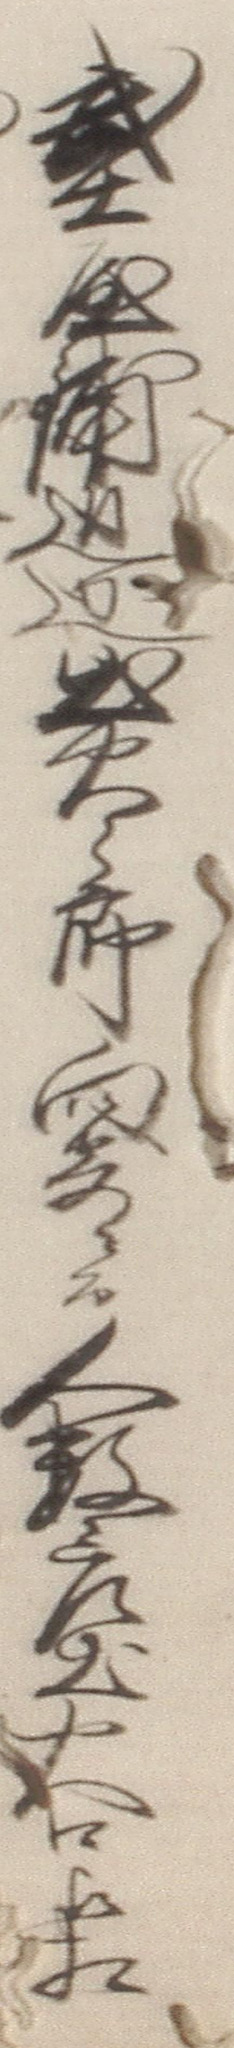武士屋鋪近辺出火之節向寄ニ而人数差出火口え相
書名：[諸国災害記録]
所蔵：東京大学地震研究所図書室 Earthquake Research Institute Library, The University of Tokyo, JAPAN
